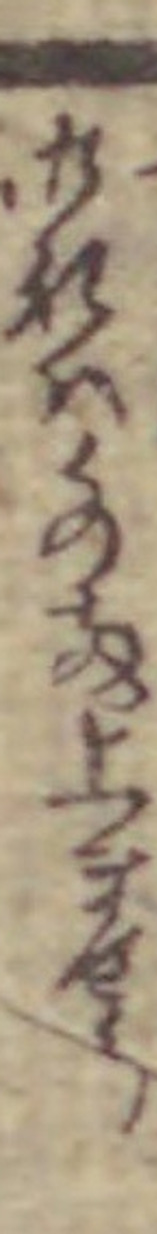御礼は千両上ませう
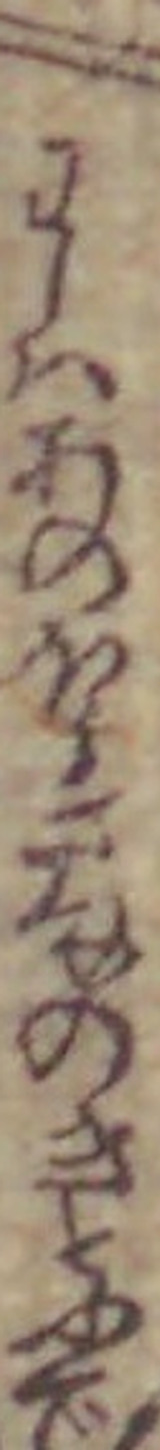わしはあのほうさまのきとふで
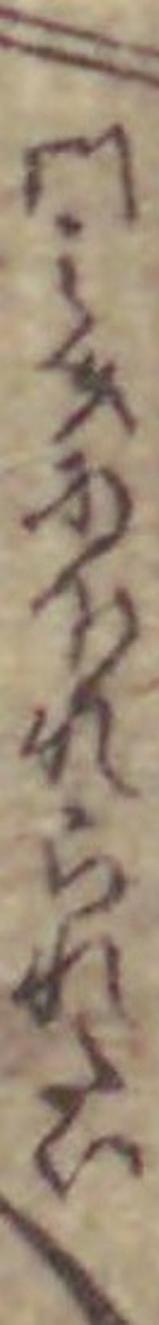門之介にほれられたい
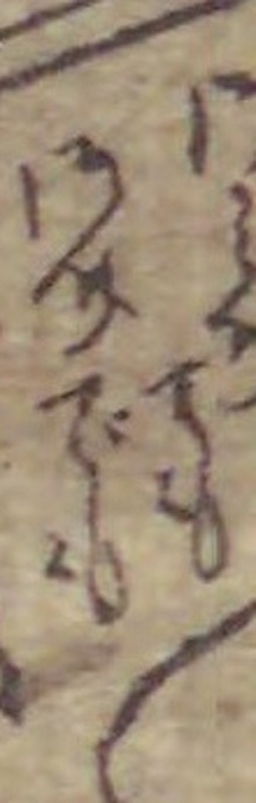門介でも
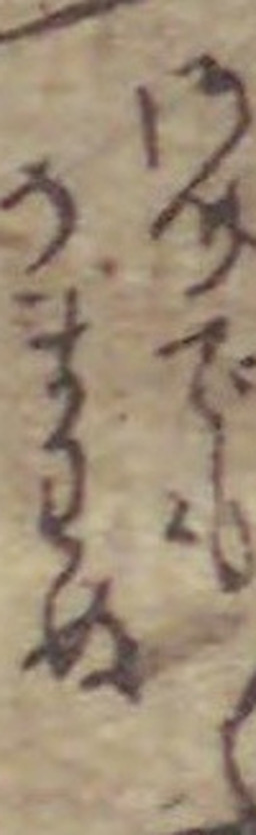かまわぬ
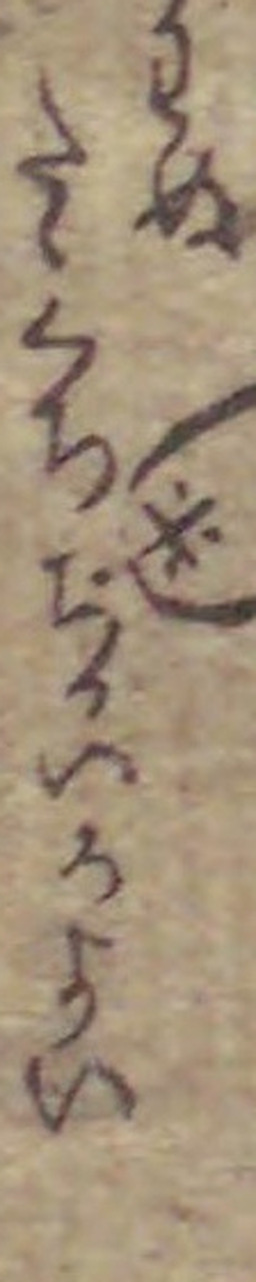たゝくちぢかいかよい

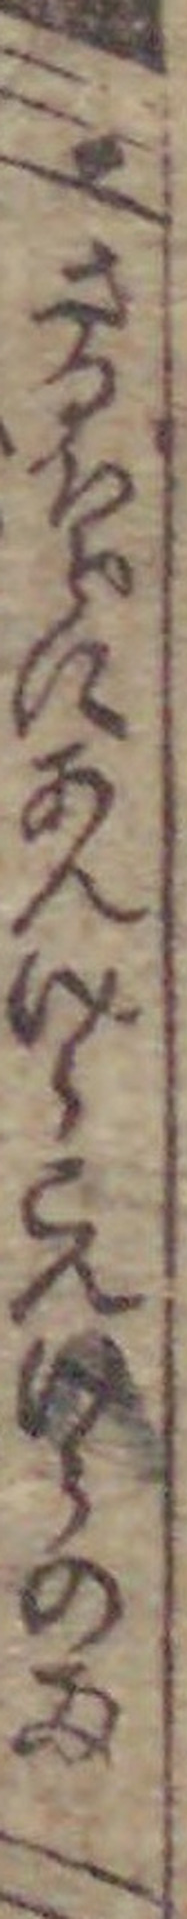さるほどにあんけらこんけらの両
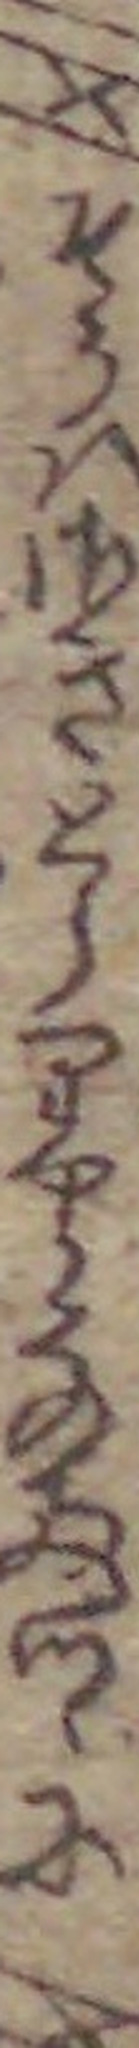そうは御きとうりやう千両つゝに
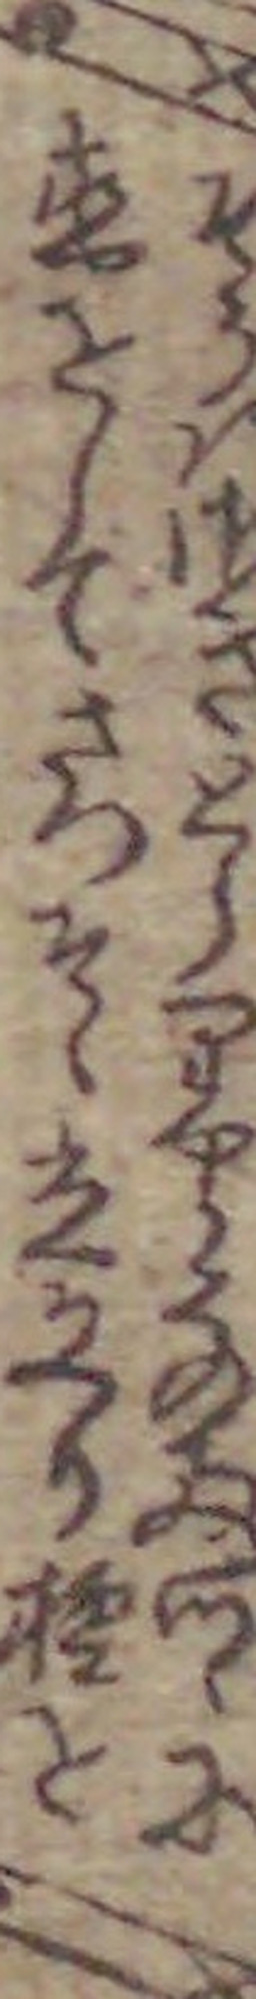直ことしてさつそく立かへり壇を
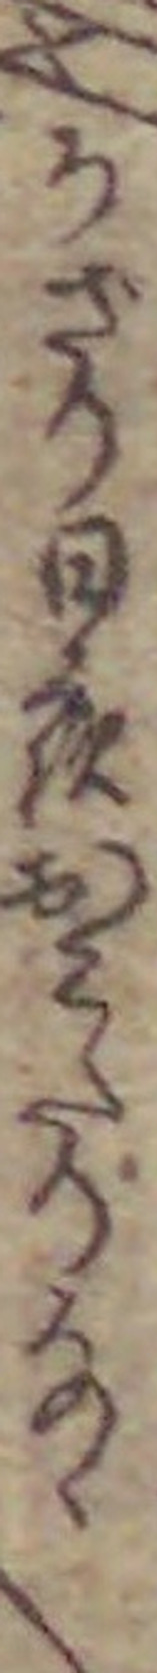かざり日夜おこたりなく
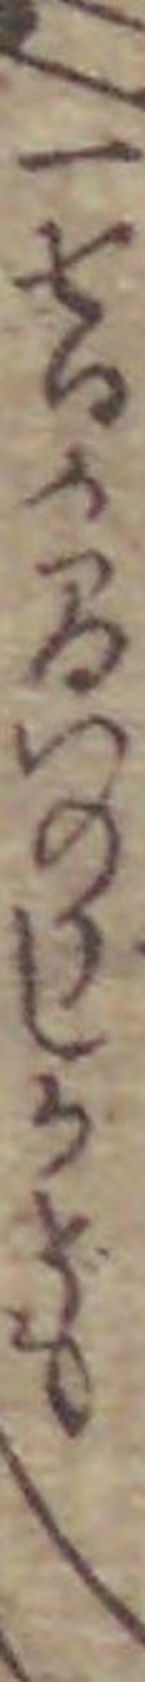一七日か間いのりしかども
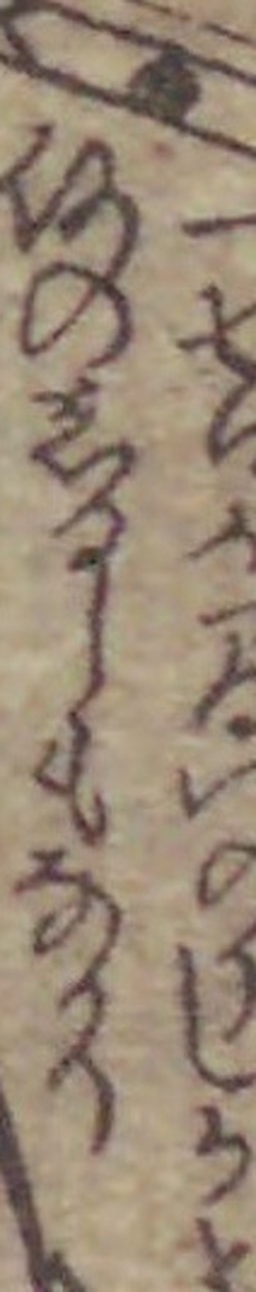何のしるしもなかり
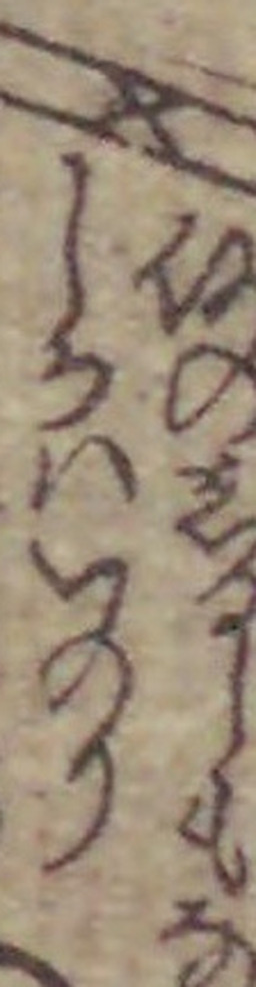しかはいのり
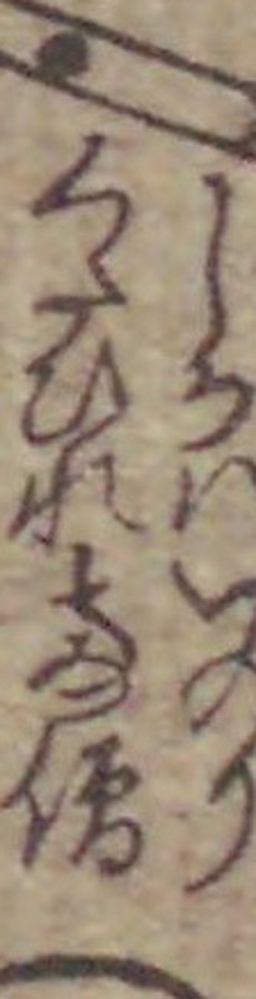くたひれ両僧
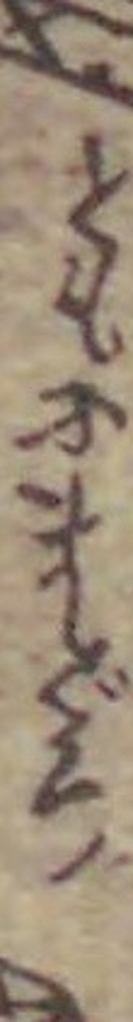ともにまどろ
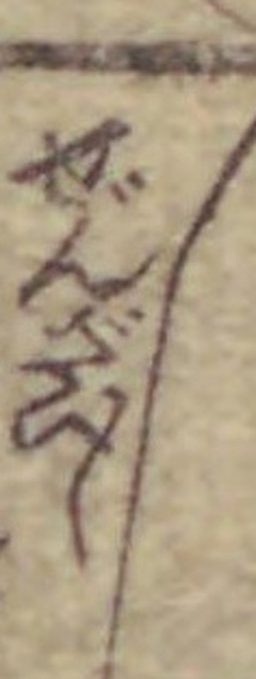ぜんざい〳〵
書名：止而道致虚録 3巻
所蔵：国立国会図書館 National Diet Library, JAPAN
